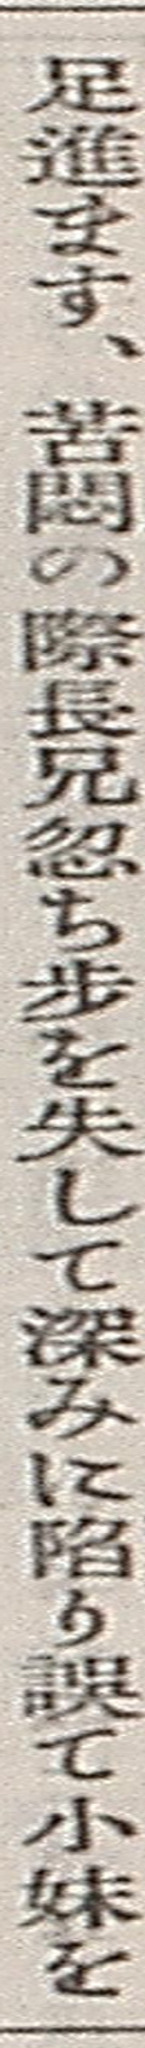足進ます、苦悶の際長兄忽ち歩を失して深みに陥り誤て小妹を
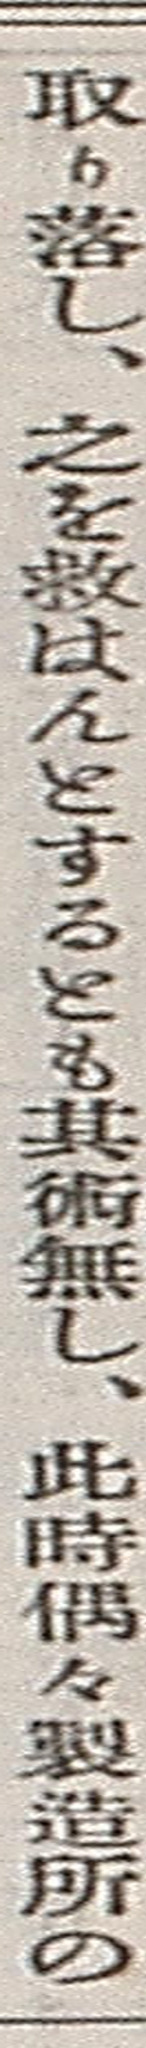取り落し、之を救はんとするとも其術無し、此時偶々製造所の
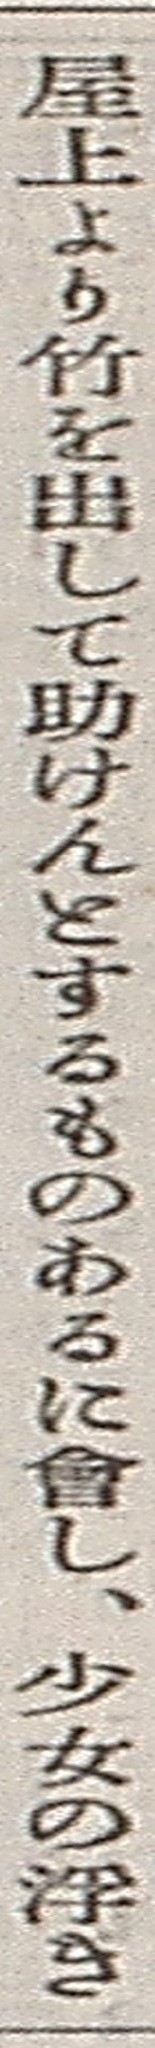屋上より竹を出して助けんとするものあるに会し、少女の浮き
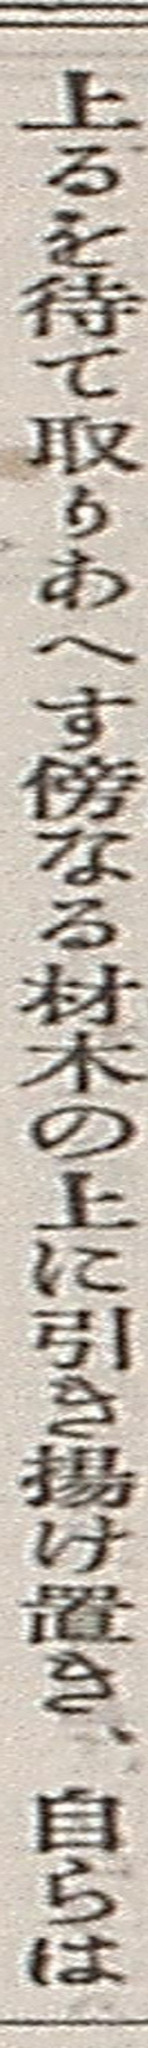上るを待て取りあへす傍なる材木の上に引き揚け置き、自らは
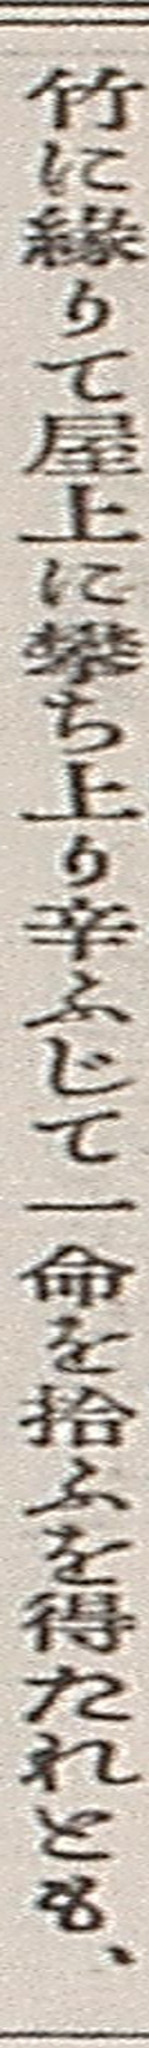竹に縁りて屋上に攀ち上り辛ふじて一命を拾ふを得たれとも、
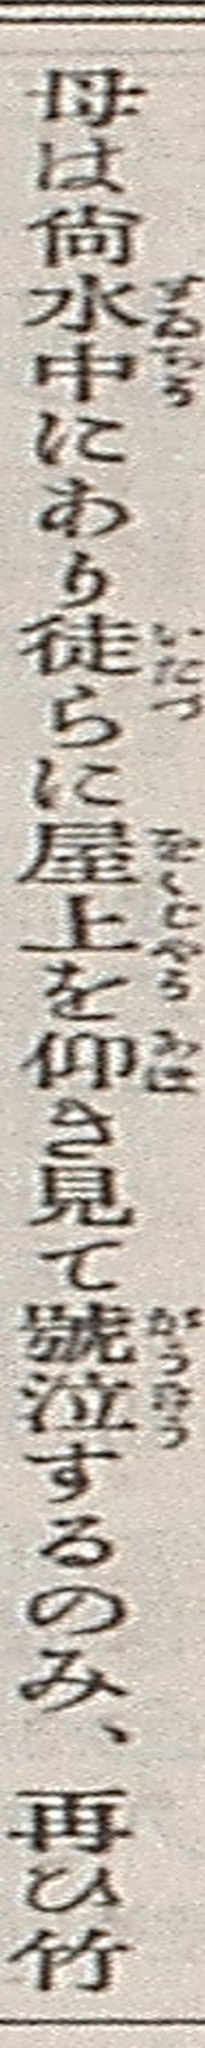母は尚水中にあり徒らに屋上を仰き見て号泣するのみ、再ひ竹
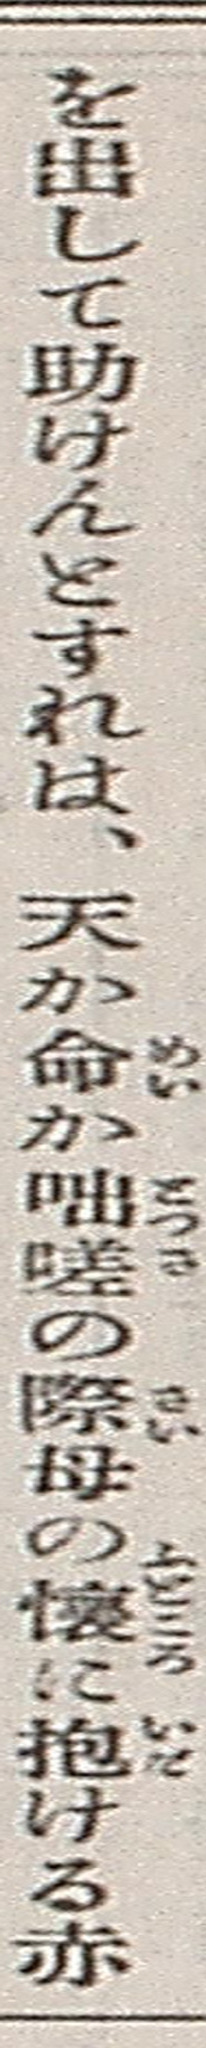を出して助けんとすれは、天か命か咄嗟の際母の懐に抱る赤
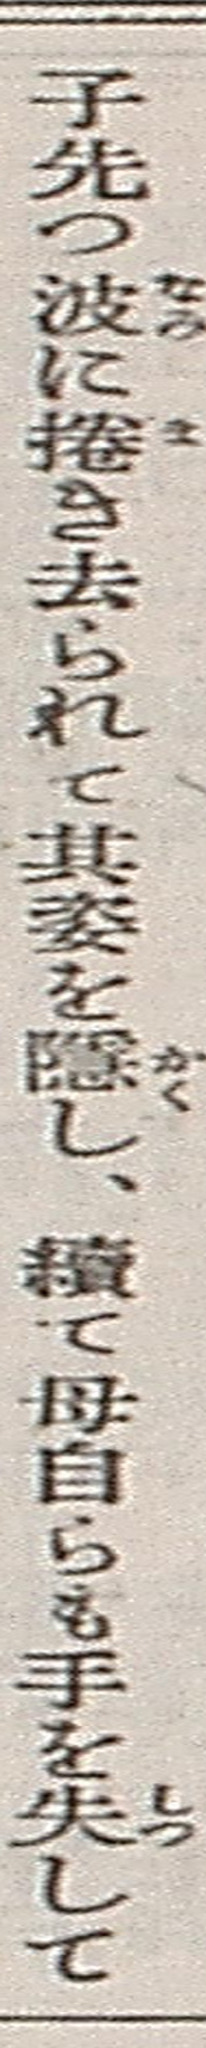子先つ波に捲き去られて其姿を隠し、続て母自らも手を失して
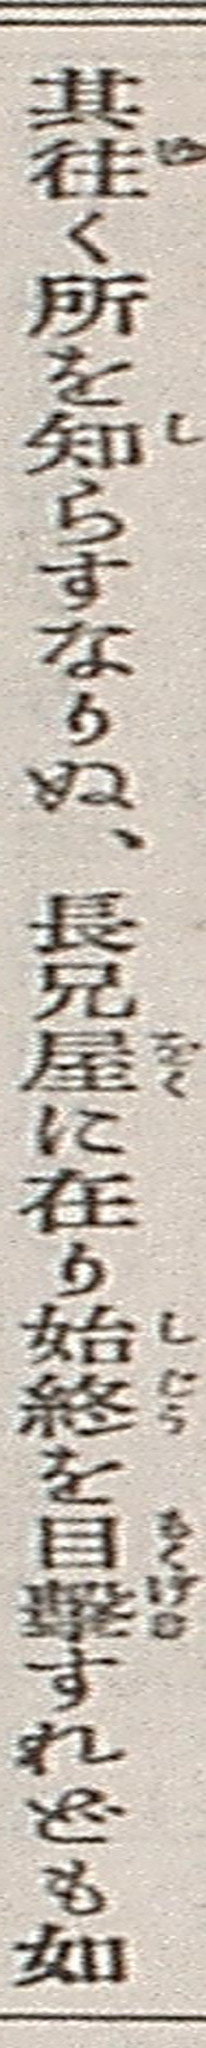其往く所を知らすなりぬ、長兄屋に在り始終を目撃すれども如
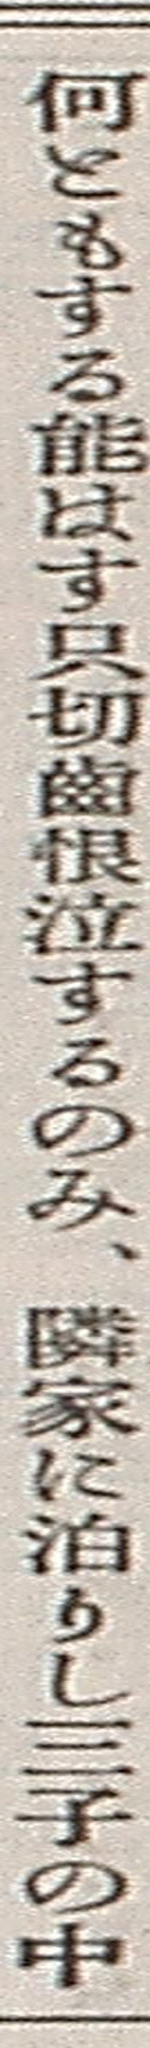何ともする能はす只切歯恨泣するの、隣家に泊りし三子の中
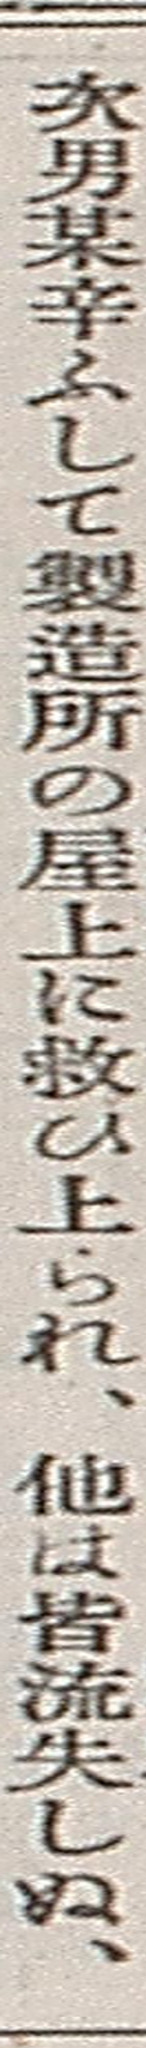次男某辛ふして製造所の屋上に救ひ上られ、他は皆流失しぬ、
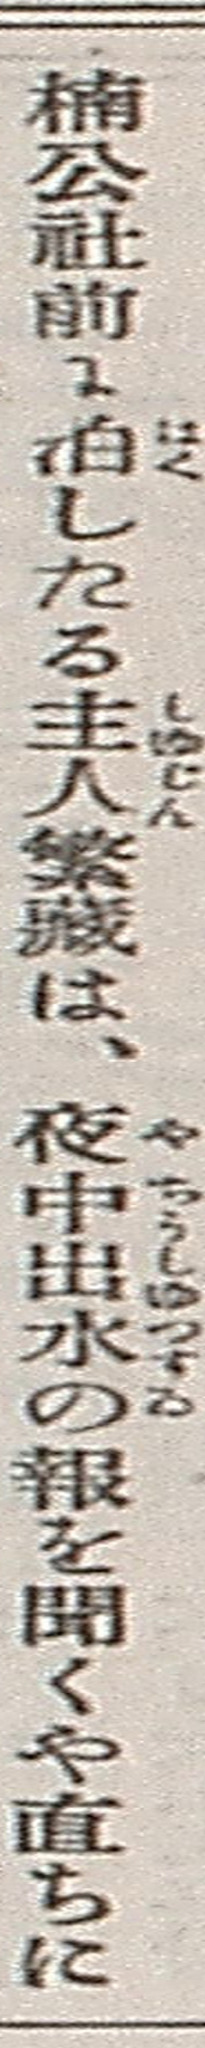楠公前に泊したる主人繁蔵は、夜中出水の報を聞くや直ちに
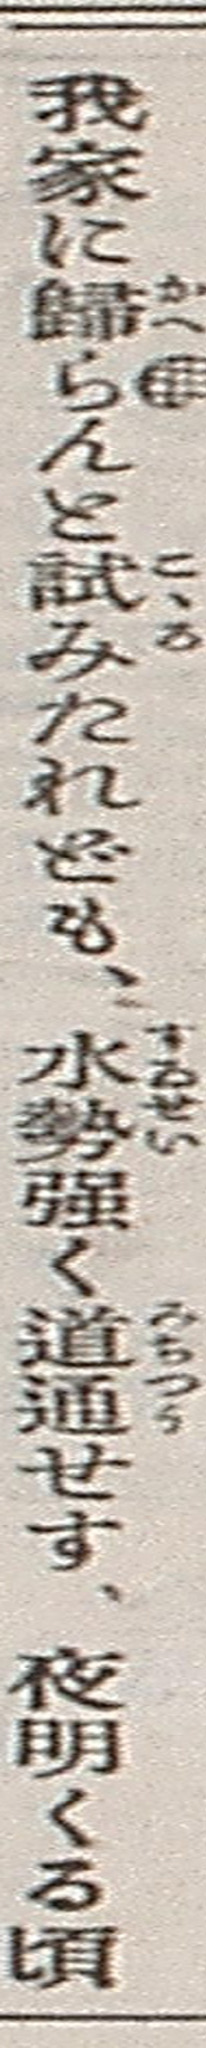我家に帰らんと試みたれども、水勢強く道通せす、夜明くる頃
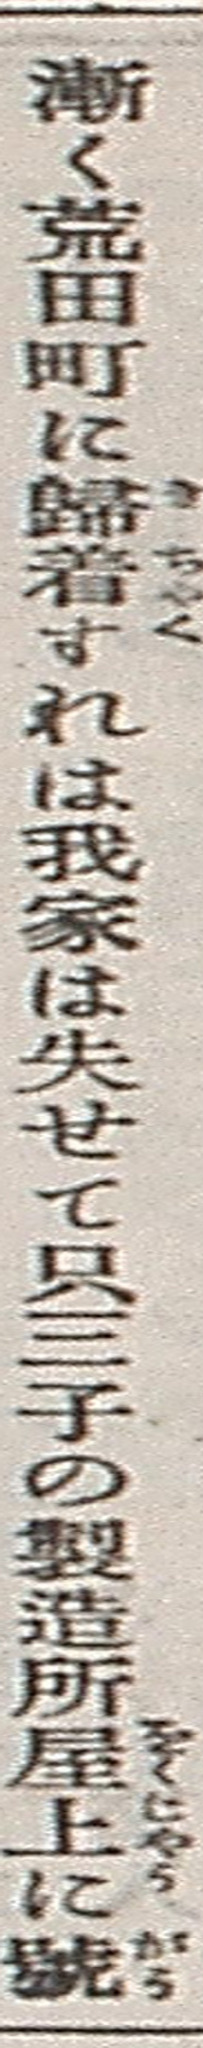漸く荒田町に帰着すれは我家は失せて只三子の製造所屋上に号
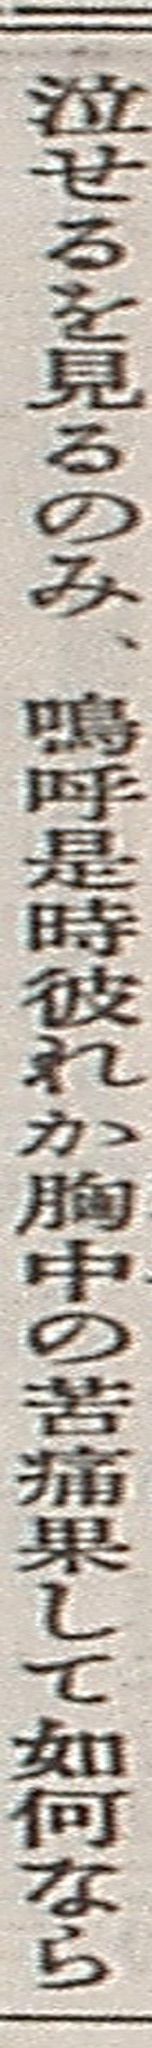泣せるを見るのみ、嗚呼是時彼れか胸中の苦痛果して如何なら

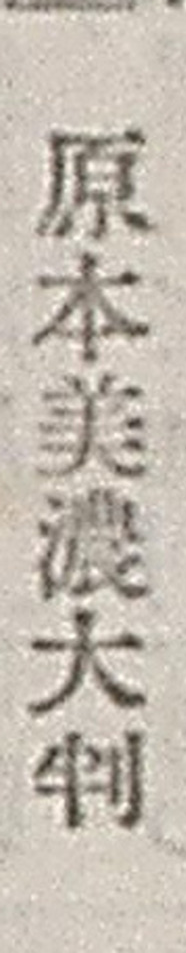原本美濃大判
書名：風俗畫報臨時増刊第百二十六號　洪水被害録（中）
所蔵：東京大学地震研究所図書室 Earthquake Research Institute Library, The University of Tokyo, JAPAN
